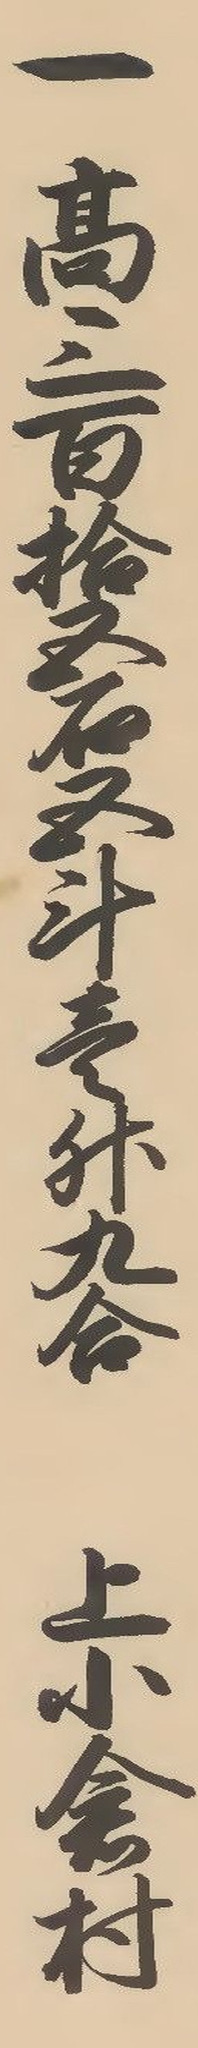一高三百拾五石五斗壱升九合上小倉村
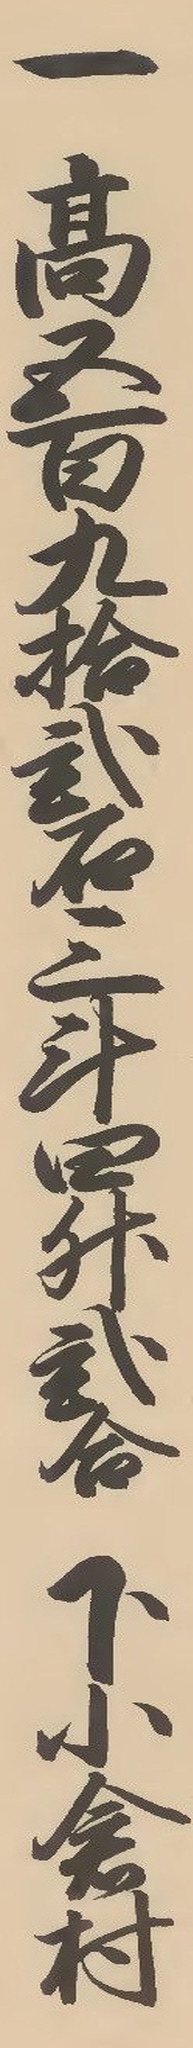一高五百九拾弐石三斗四升弐合下小倉村
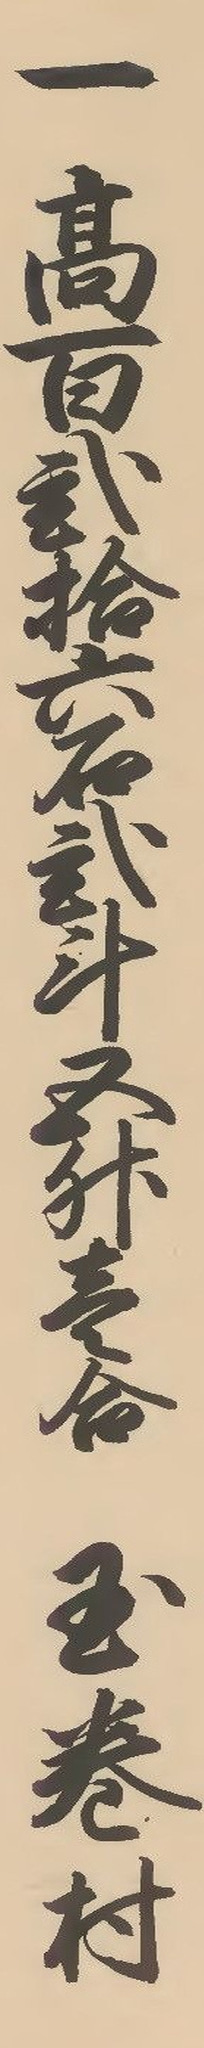一高百弐拾六石弐斗五升壱合玉巻村
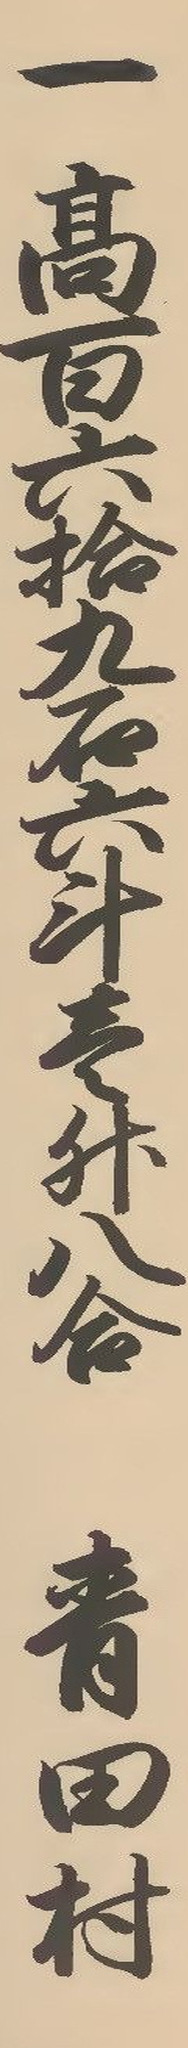一高百六拾九石六斗壱升八合青田村
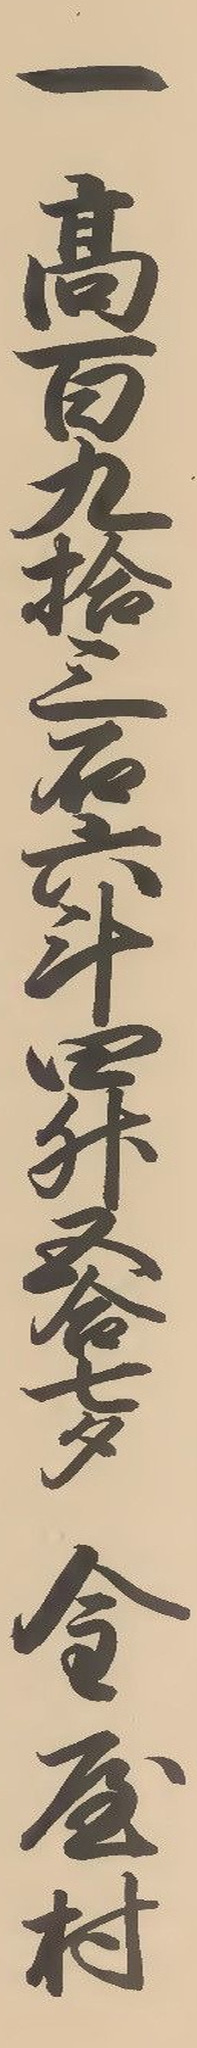一高百九拾三石六斗四升五合七勺金屋村
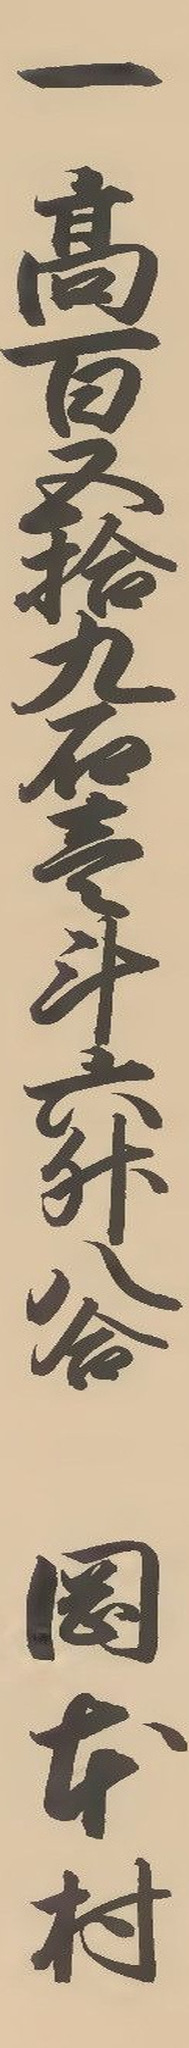一高百五拾九石壱斗六升八合岡本村
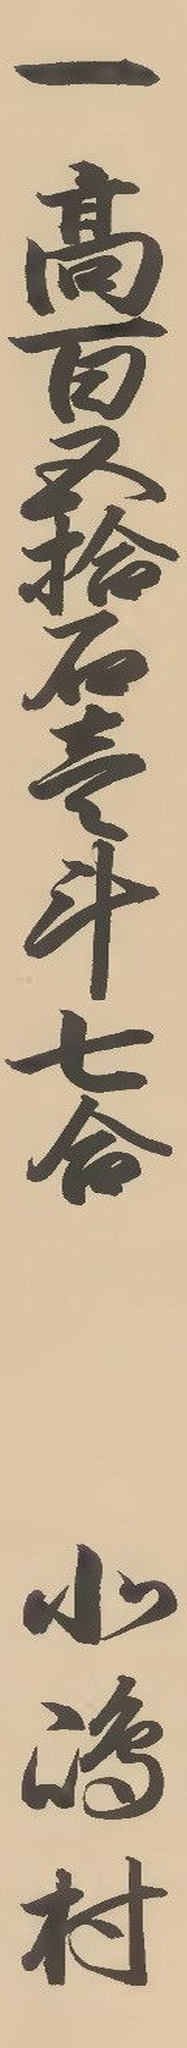一高百五拾石壱斗七合北島村
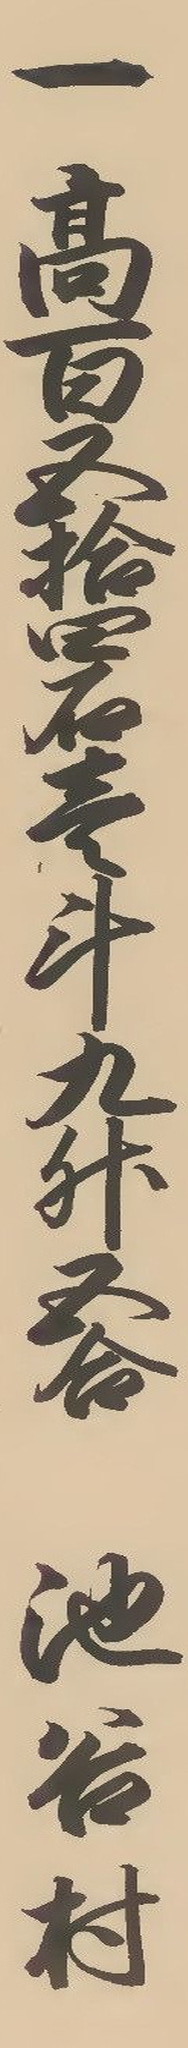一高百五拾四石壱斗九升五合池谷村

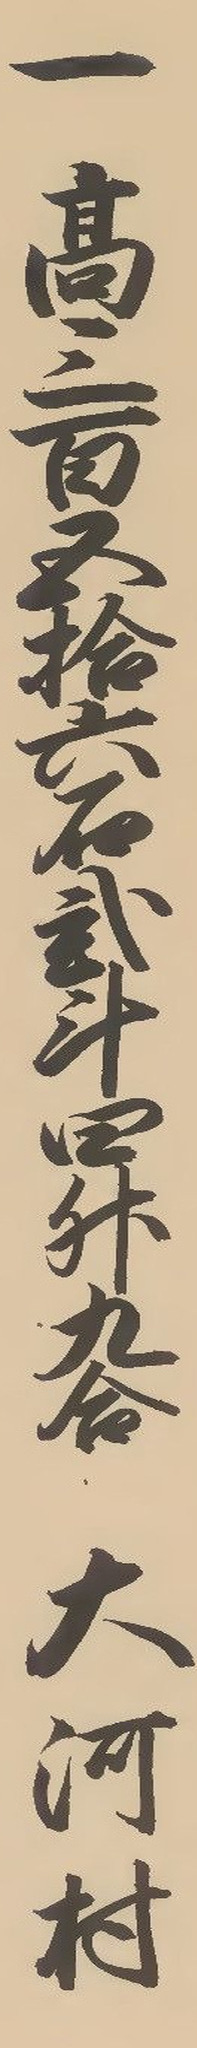一高三百五拾六石弐斗四升九合大河村
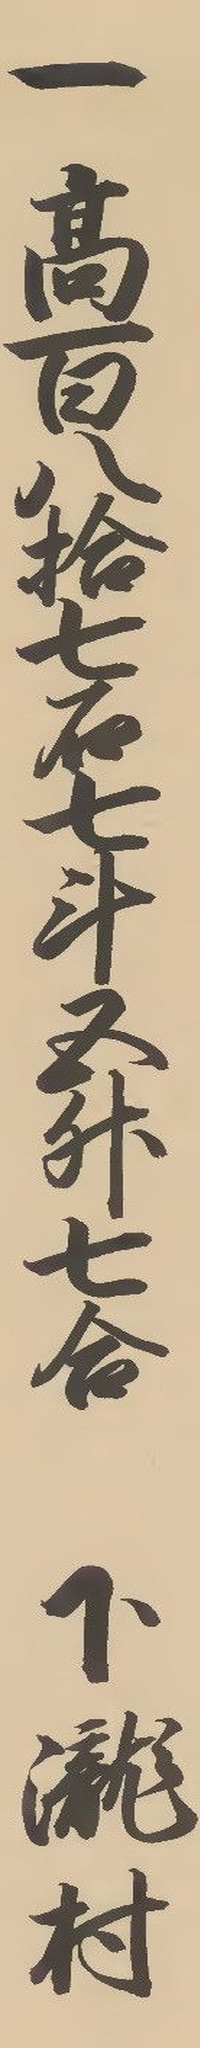一高百八拾七石七斗五升七合下滝村
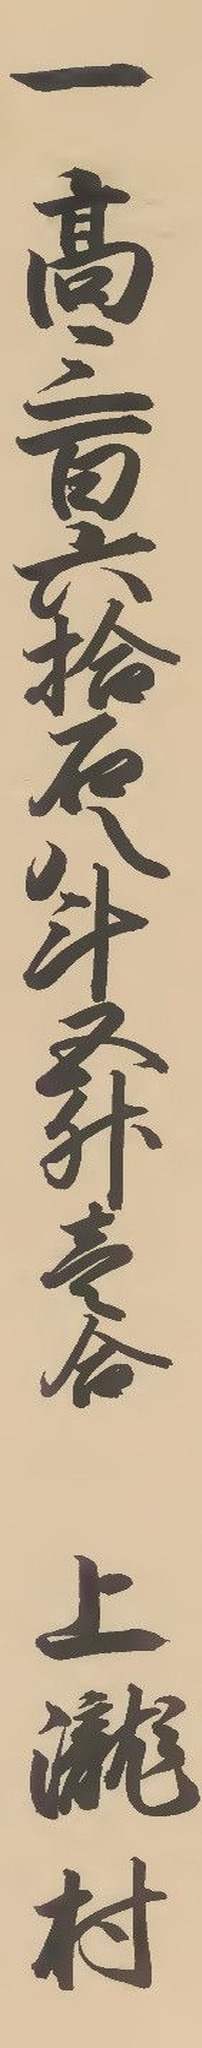一高三百六拾石八斗五升壱合上滝村
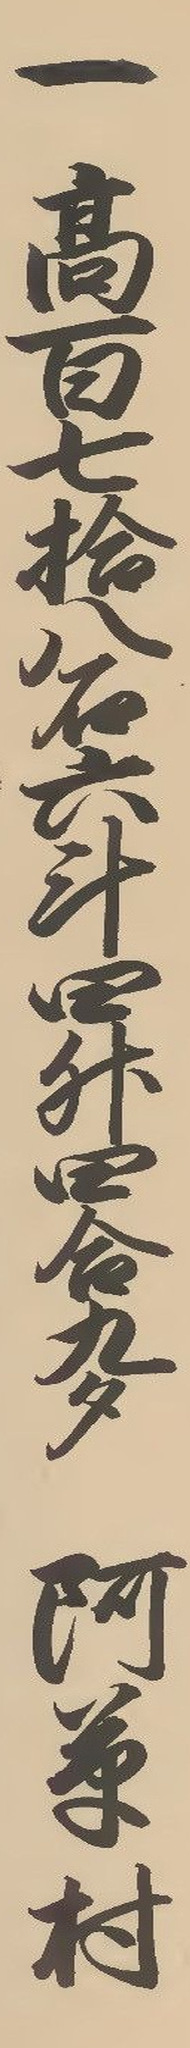一高百七拾八石六斗四升四合九勺阿草村
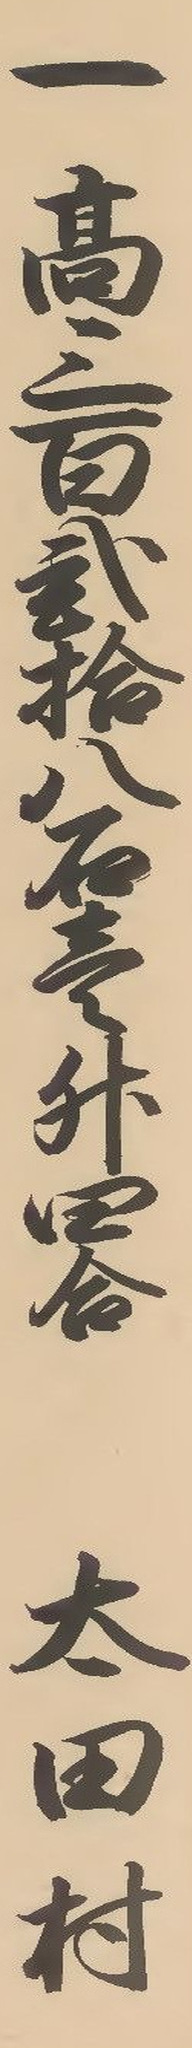一高三百弐拾八石壱升四合太田村
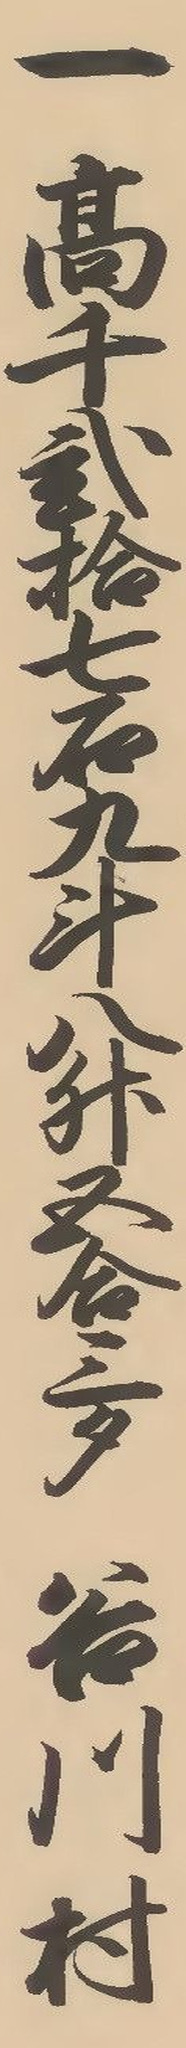一高千弐拾七石九斗八升五合三勺谷川村

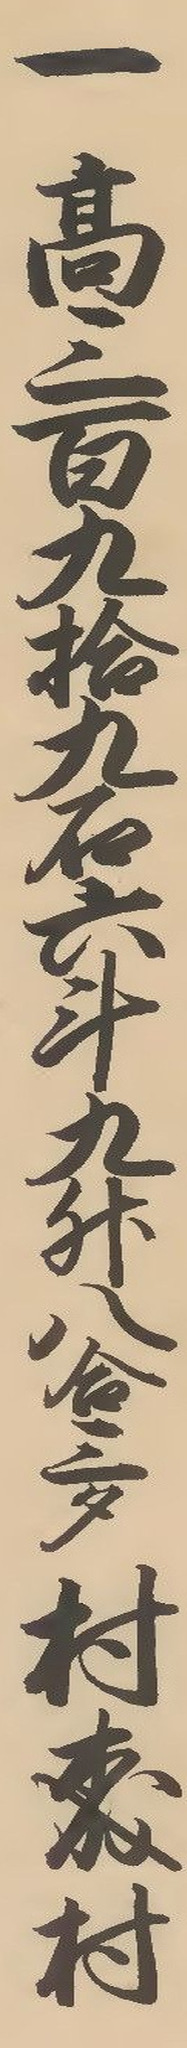一高三百九拾九石六斗九升八合三勺村森村
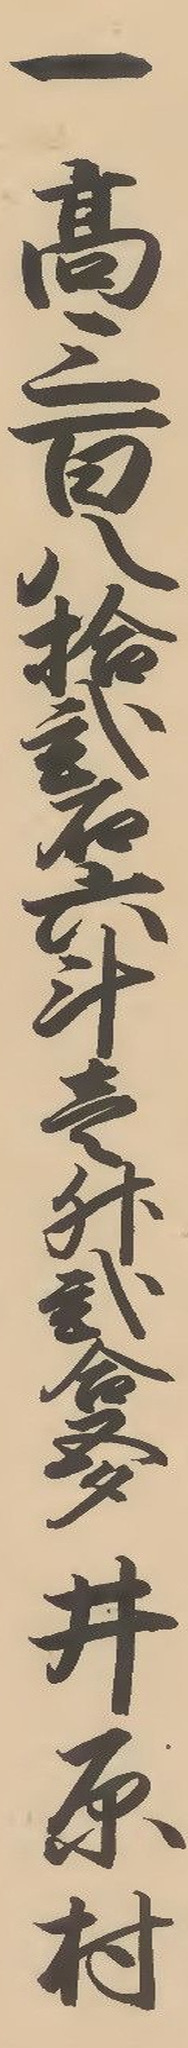一高三百八拾弐石六斗壱升弐合五勺井原村
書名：丹波国郷帳
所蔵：国立公文書館 National Archives of Japan
